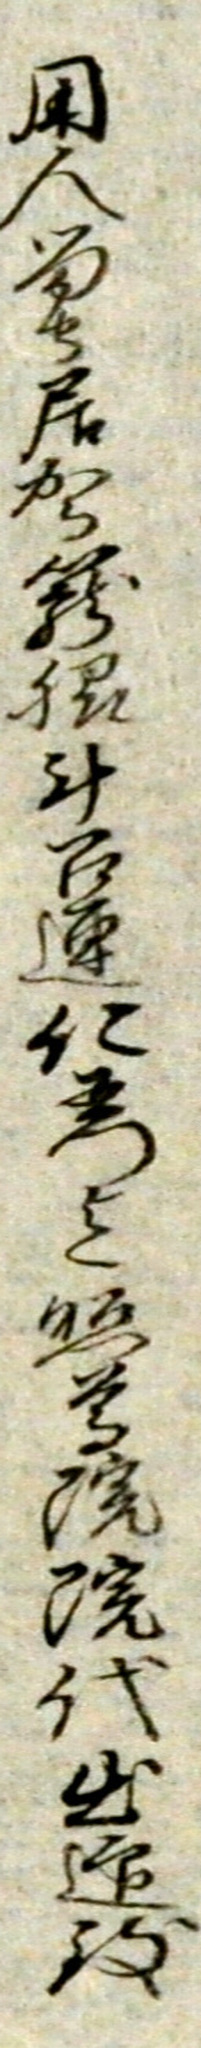用人留守居駕籠脇斗召連仁王門迄照尊院院代出迎致
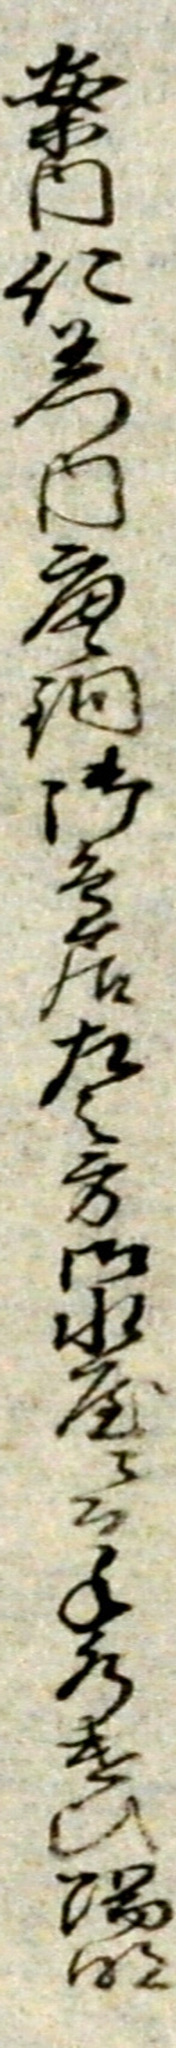案内仁王門内唐銅御鳥居左之方御水屋ニ而手水遣ひ陽明
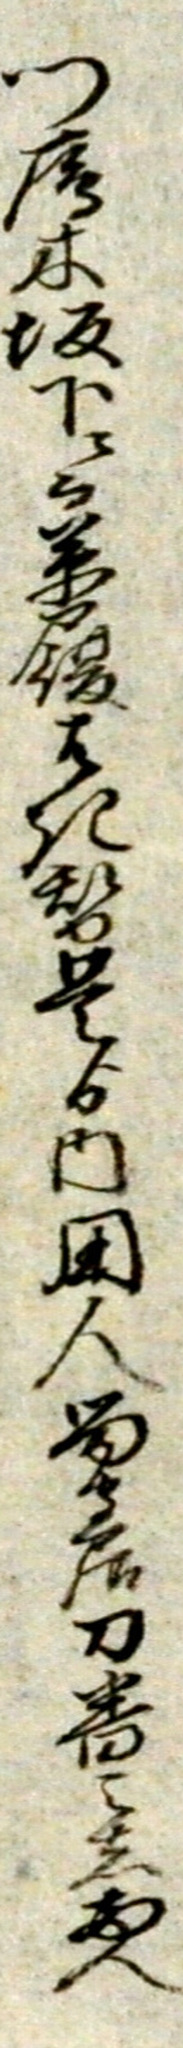門雁木坂下ニ而草履はき替是ゟ内用人留守居刀番之者両
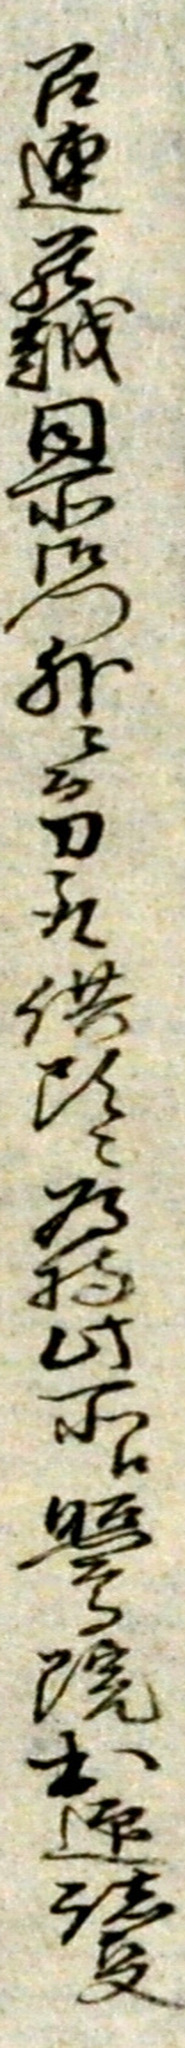罷越同所御門外ニ而刀取供頭ニ為持此所江照尊院出迎是
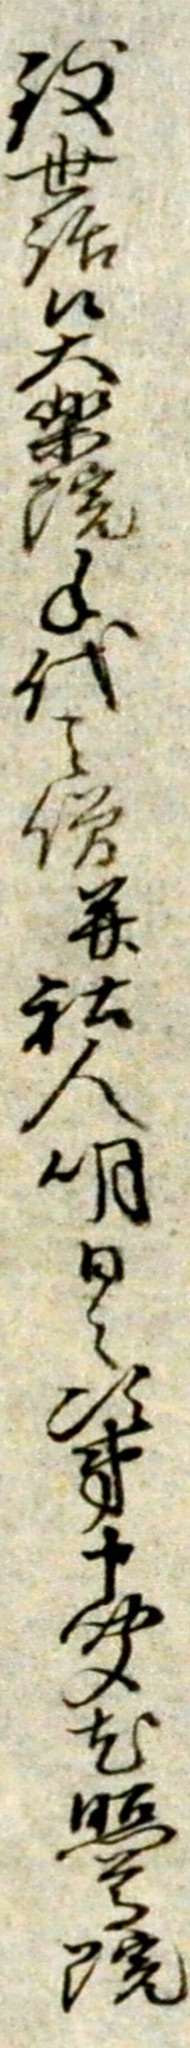出迎諸叓致世話候大楽院手代之僧幷社人明日之次第申聞
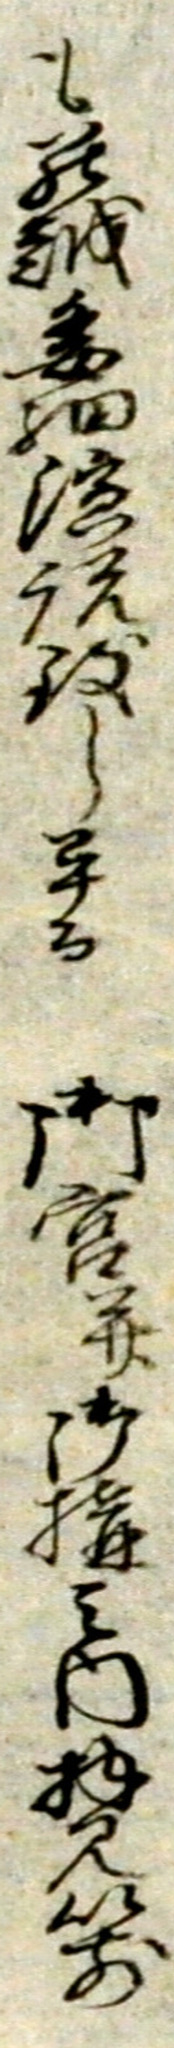も罷越委細演説致し畢而御宮幷御構之内拝見以前
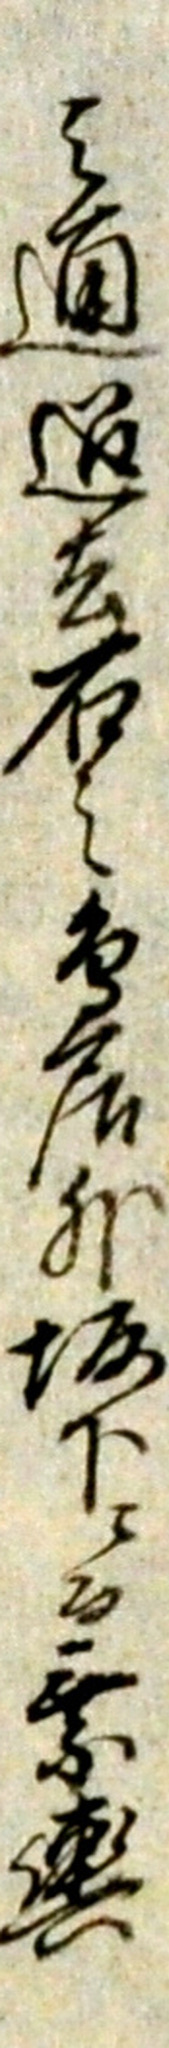之道退去石之鳥居外坂下ニ而乗輿
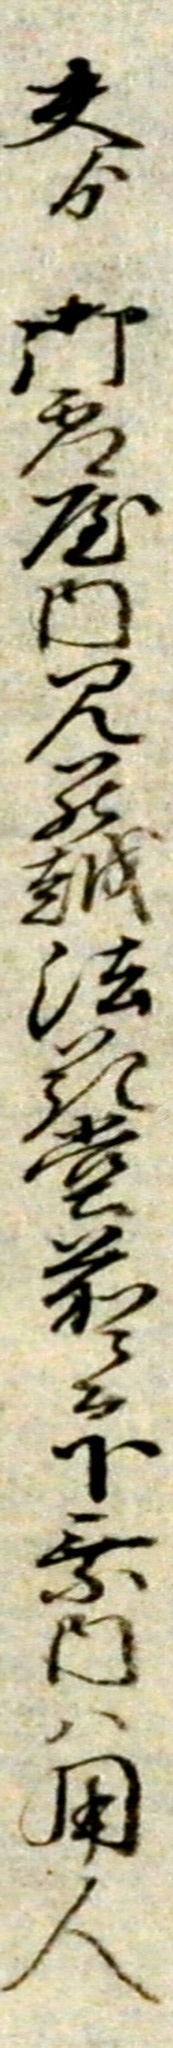夫ゟ御霊屋内見罷越法花堂前ニ而下乗内ハ用人
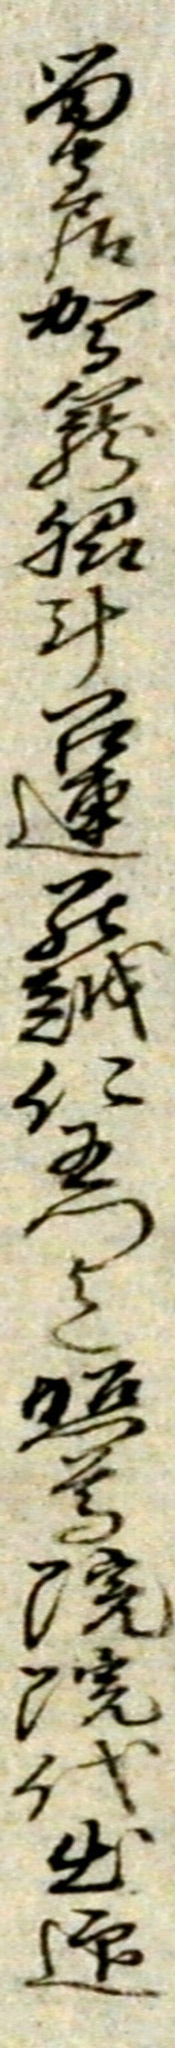留守居駕籠脇計召連罷越仁王門迄照尊院院代出迎
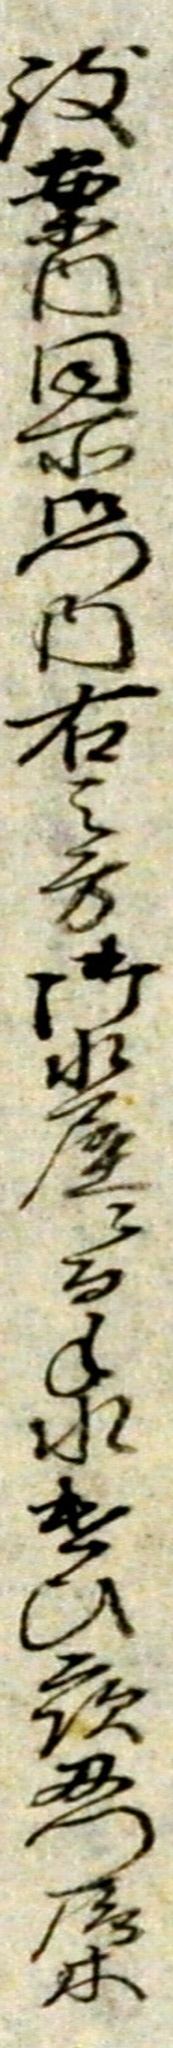致案内同所御門内右之方御水屋ニ而手水遣ひ夜刃門雁木
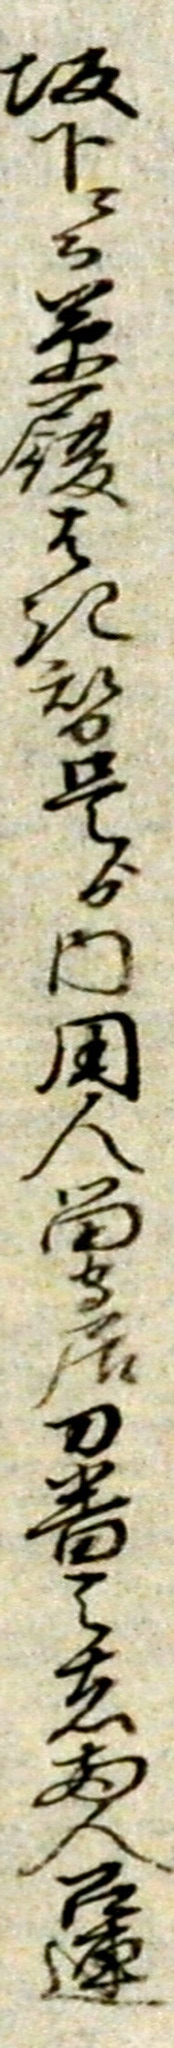坂下ニ而草履はき替是ゟ内用人留守居刀番之者両人召連
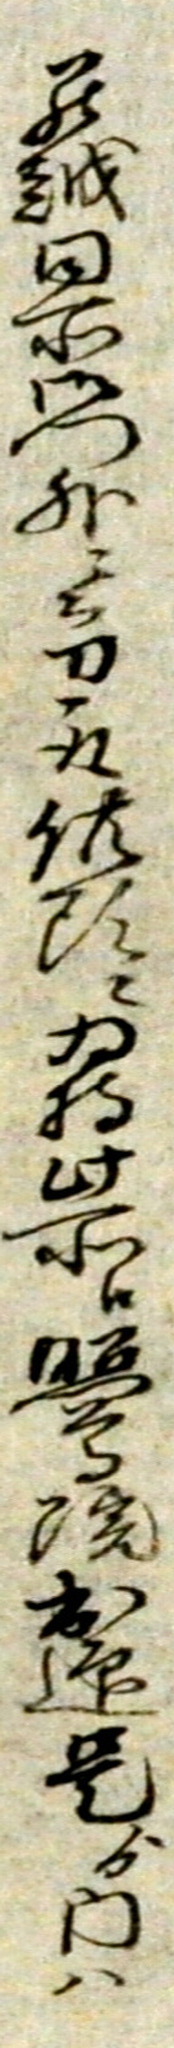罷越同所御門外ニ而刀取供頭ニ為持此所江照尊院出迎是
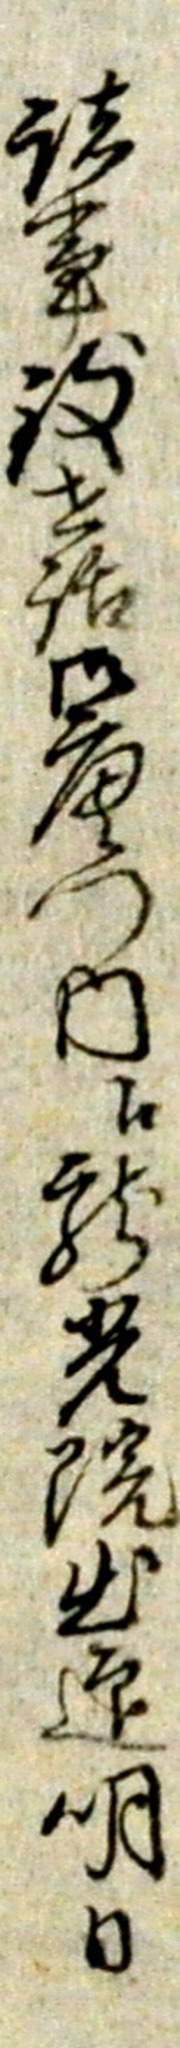諸事致世話御唐門内江龍光院出迎明日
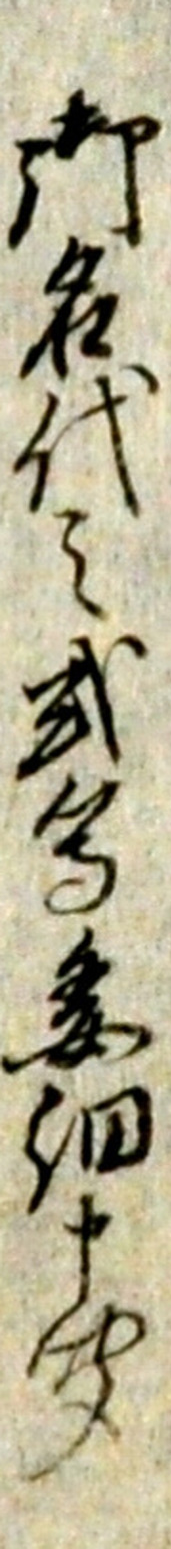御名代之式等委細申聞
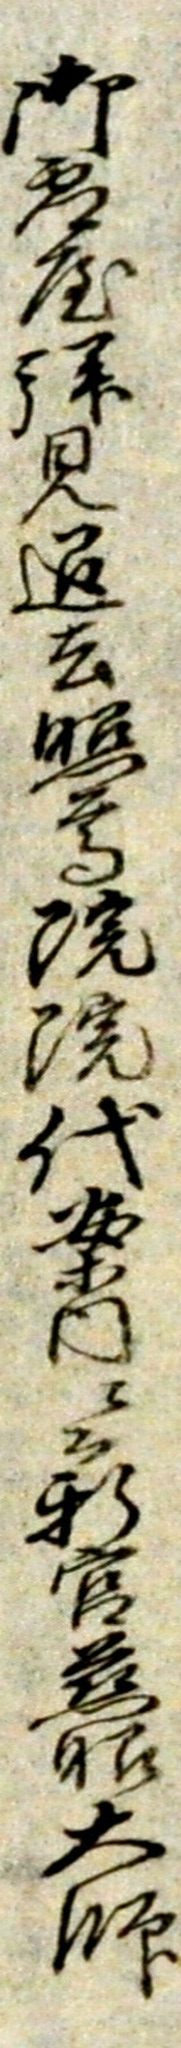御霊屋拝見退去照尊院院代案内ニ而新宮慈眼大師
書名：日光御名代相勤候節ノ留
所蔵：伊那市立高遠町図書館・合同会社AMANE
